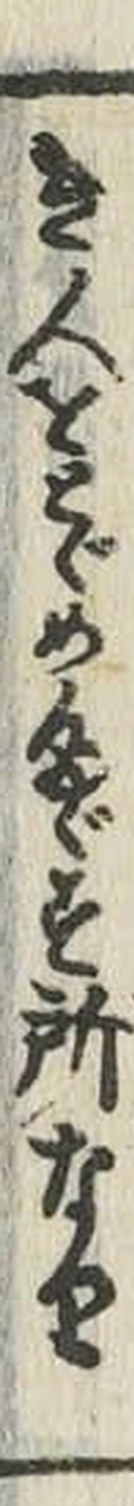き人をとゞめたゞす所なり
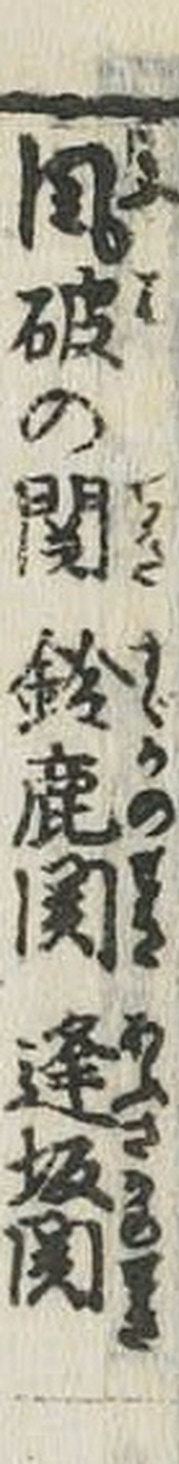風破の関鈴鹿関逢坂関
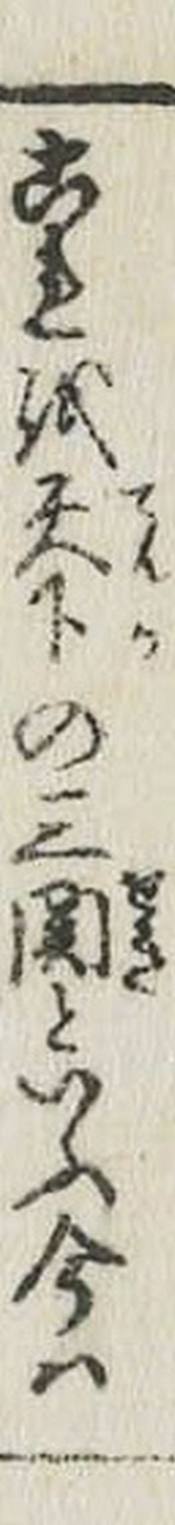これを天下の三関といふ今は
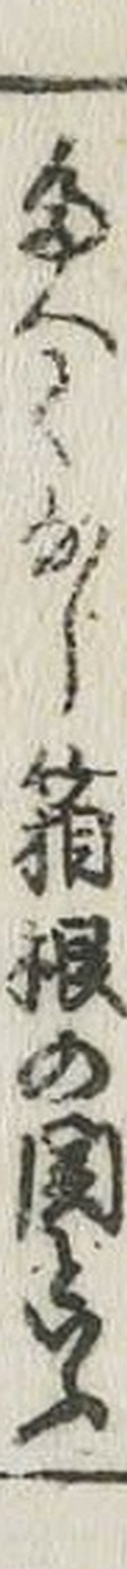たへてなし箱根の関といふ
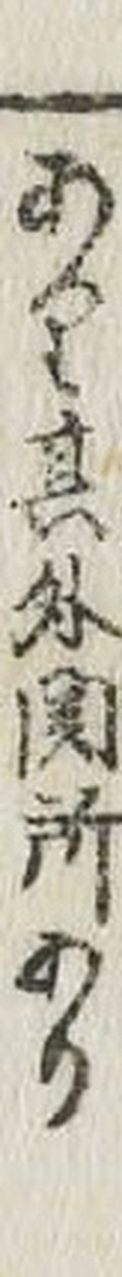あり其外関所あり
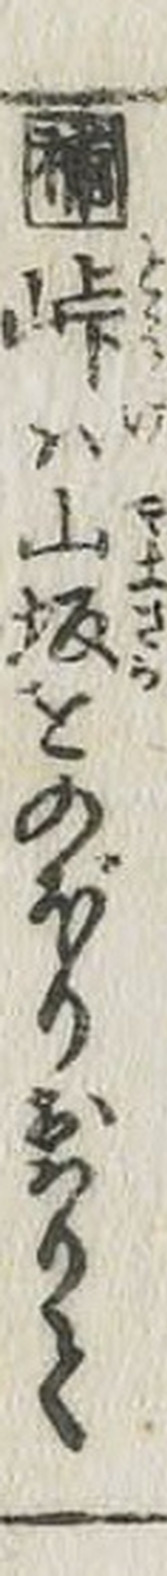補峠は山坂をのぼりおはりて
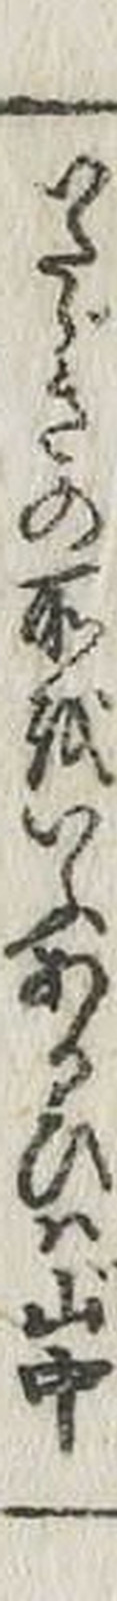いたゞきの所をいふあるひは山中
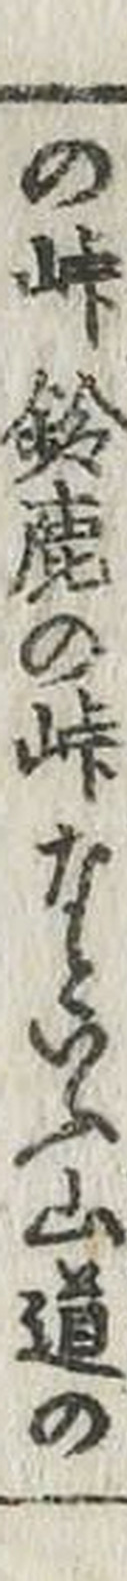の峠鈴鹿の峠なといふ山道の
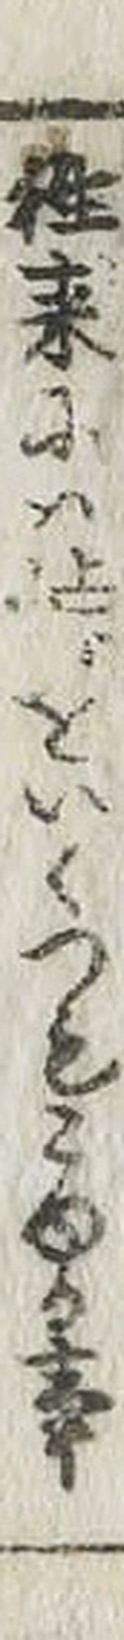往来には峠をいくつもこゆる事
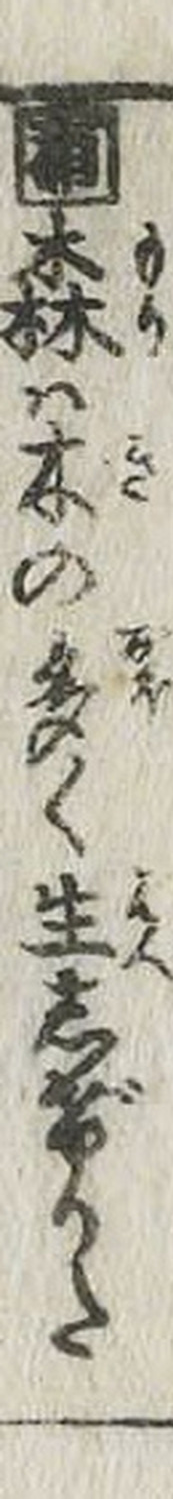補森は木の多く生しげりた
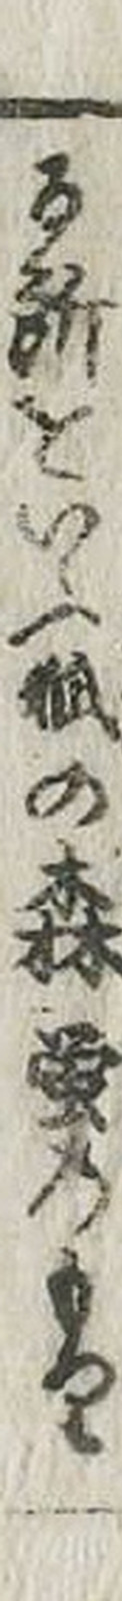る所をいふ狐の森蛍のもり
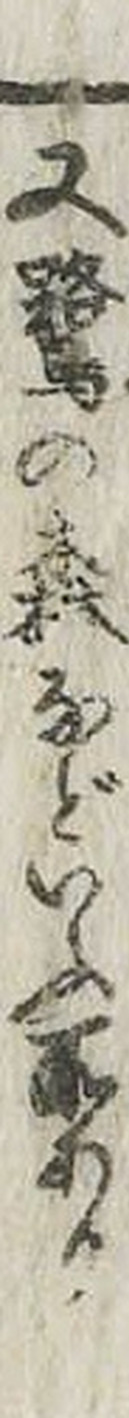又鷺の森などいふ所あり
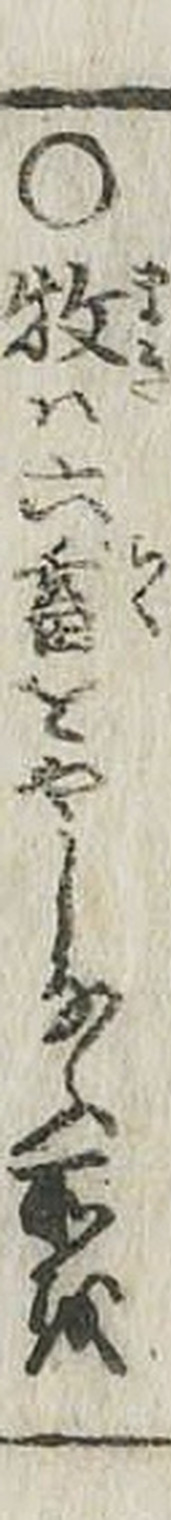○牧は六畜をやしなふ所を
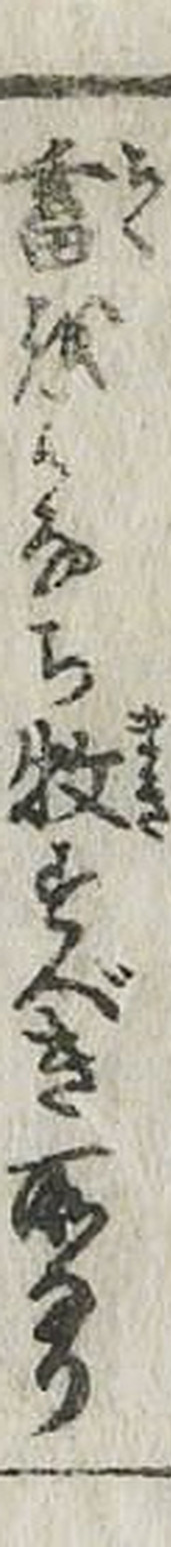畜をはなち牧すべき所なり
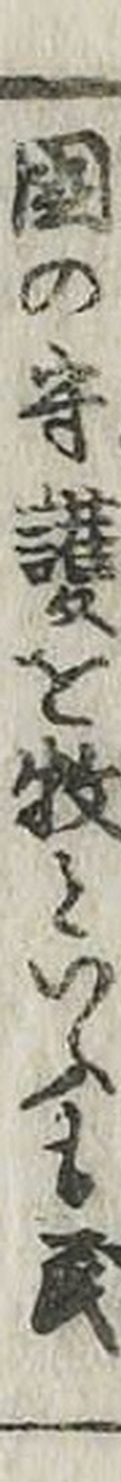国の守護を牧といふも民
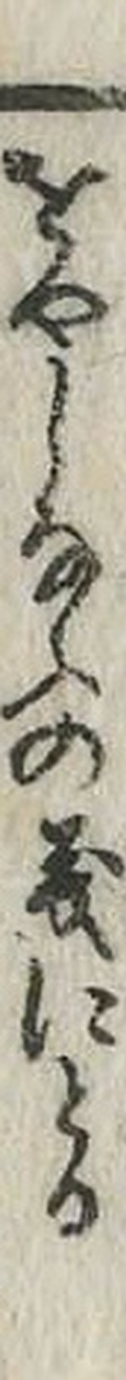をやしなふの義にとる
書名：増補頭書訓蒙図彙大成 10巻 2:巻之1-3
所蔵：東京学芸大学教育コンテンツアーカイブ
